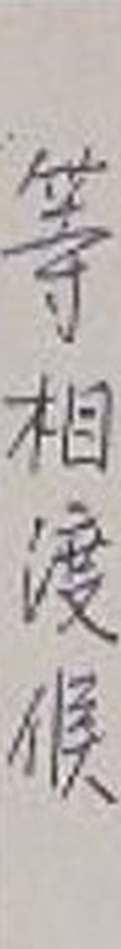等相渡候
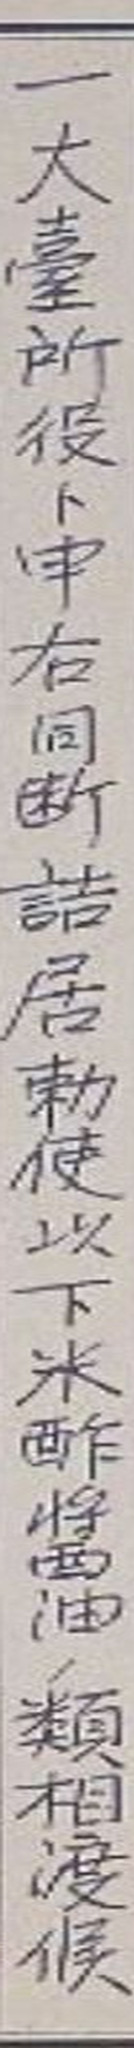一大台所役と申右同断詰居勅使以下米酢醤油の類相渡候
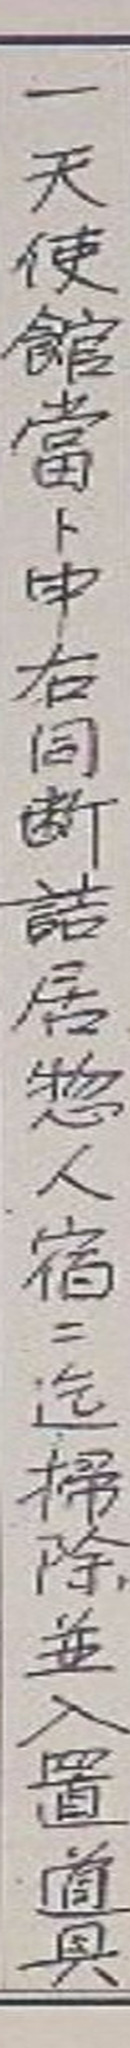一天使館当と申右同断詰居惣人宿に迄掃除並入置道具
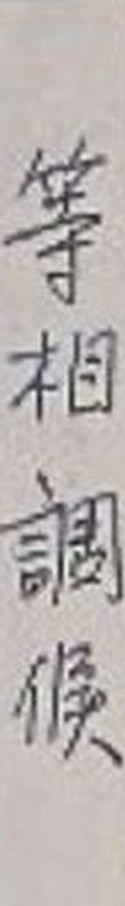等相調候
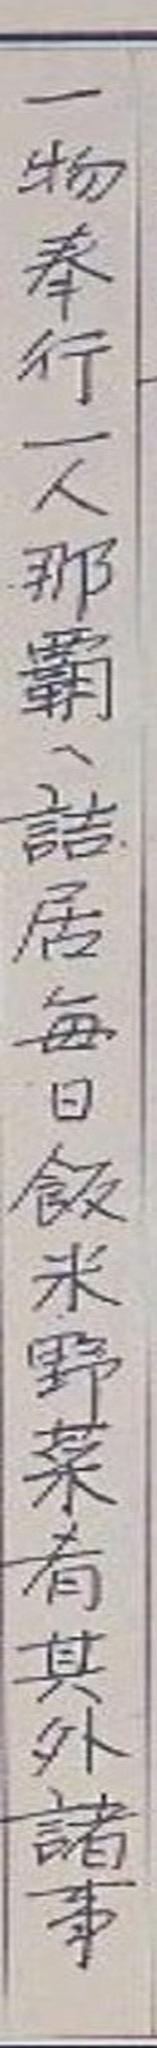一物奉行一人那覇へ詰居毎日飯米野菜肴其外諸事
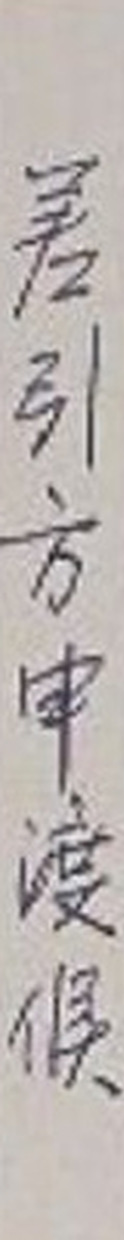差引方申渡候
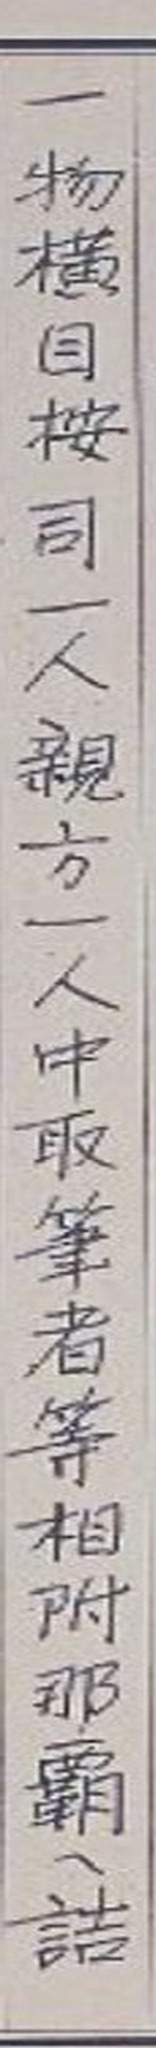一物横目按司一人親方一人中取筆者等相附那覇へ詰
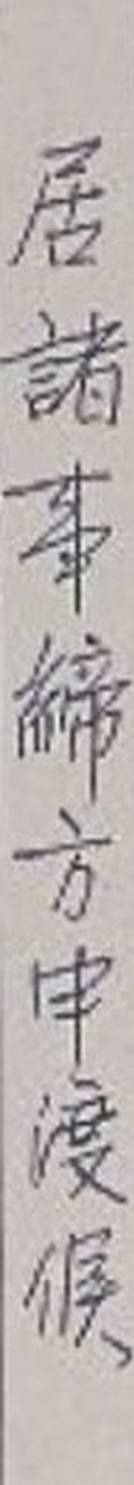居諸事締方申渡候

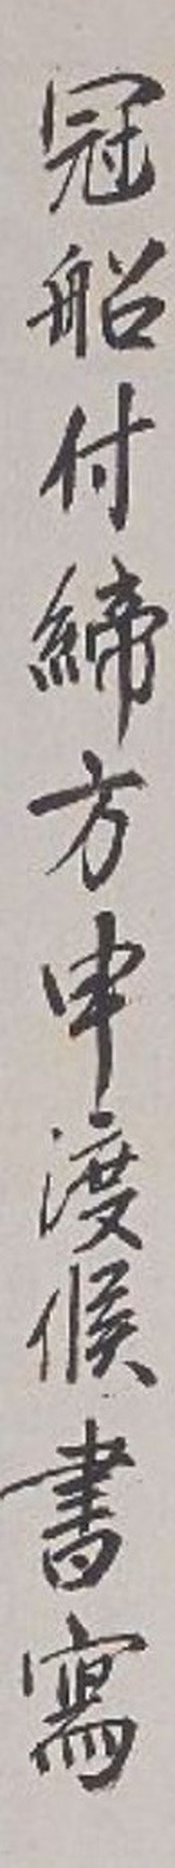冠船付締方申渡候書写

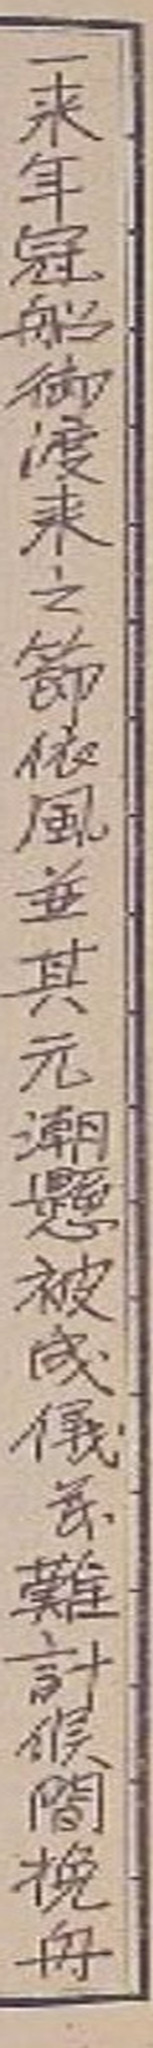一来年冠船御渡来之節依風並其元潮懸被成儀も難計候間挽舟
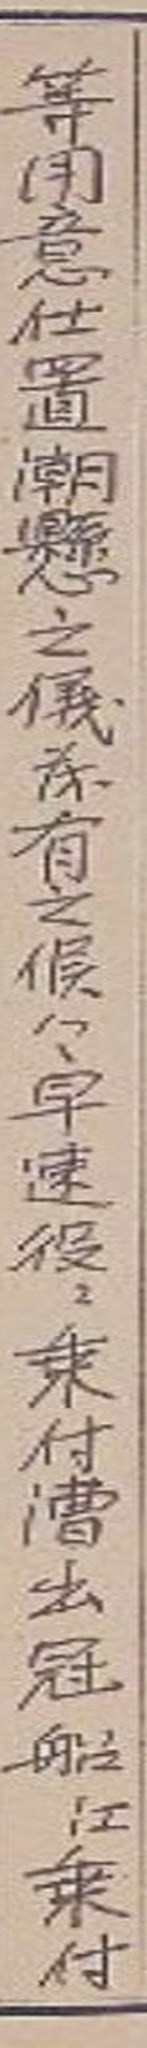等用意仕置潮懸之儀も有之候はゝ早速役々乗付漕出冠船え乗付
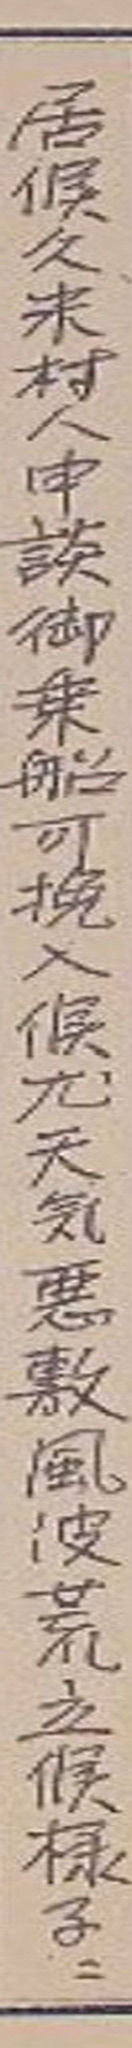居候久米村人申談御乗船可挽入候尤天気悪敷風波荒立候様子に
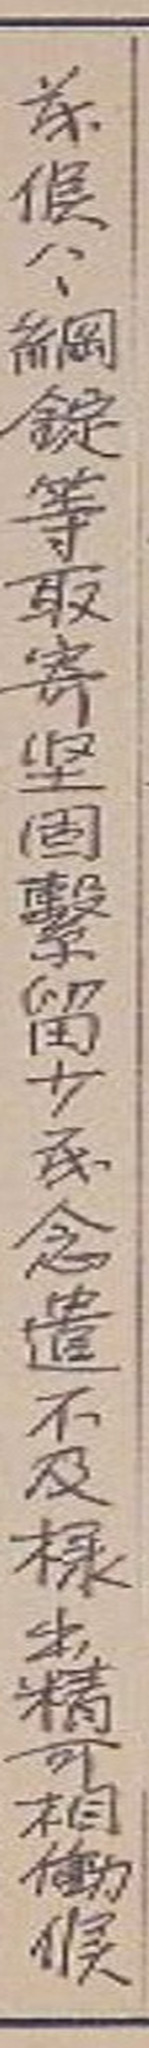も候はゝ綱錠等取寄固繋留少も念遣不及様出精可相働候
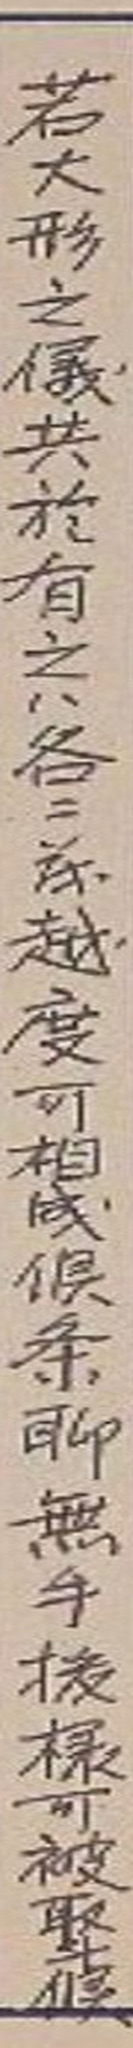若大形之儀共於有之は各にも越度可相成候条聊無手抜様可被取計候
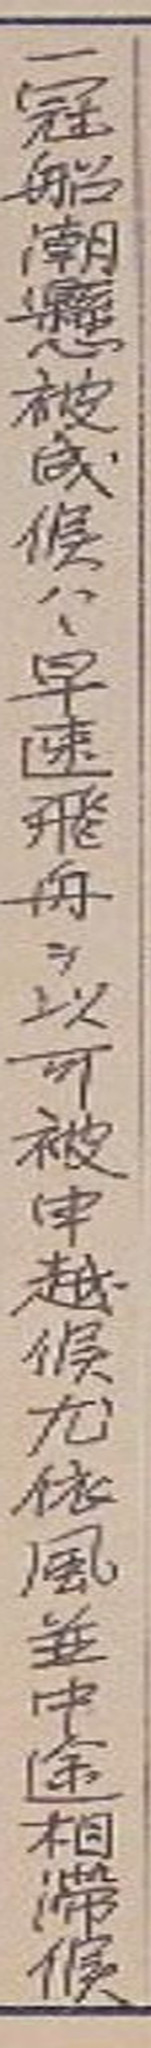一冠船潮懸被成候はゝ早速飛舟を以可被申越候尤依風並中途相滞候
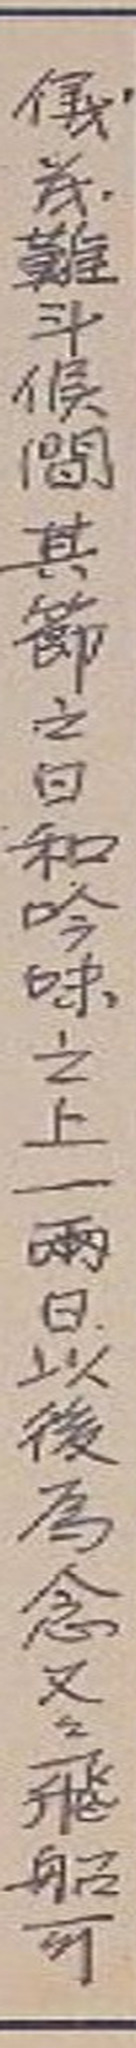儀も難計候間其節之日和吟味之上一両日以後為念又々飛船可
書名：支那冊封使来琉諸記 下巻
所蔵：University of the Ryukyus Library
